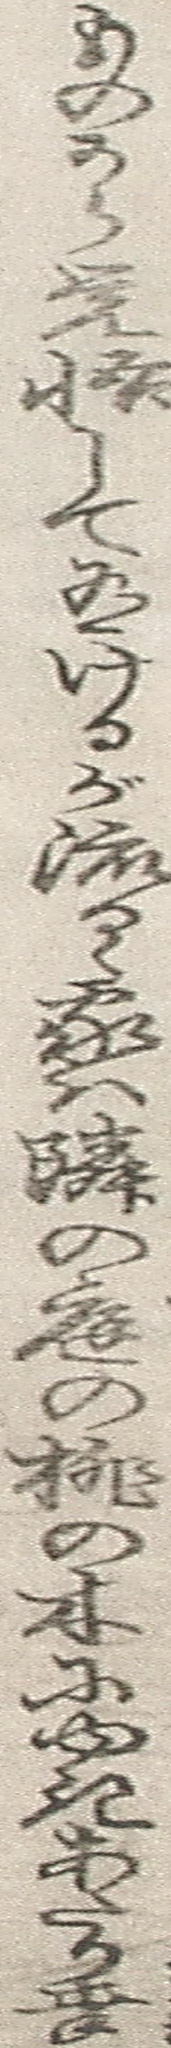ものから覚悟して有けるが流るゝ家ハ隣の庭の桃の木にゆきあたり幸
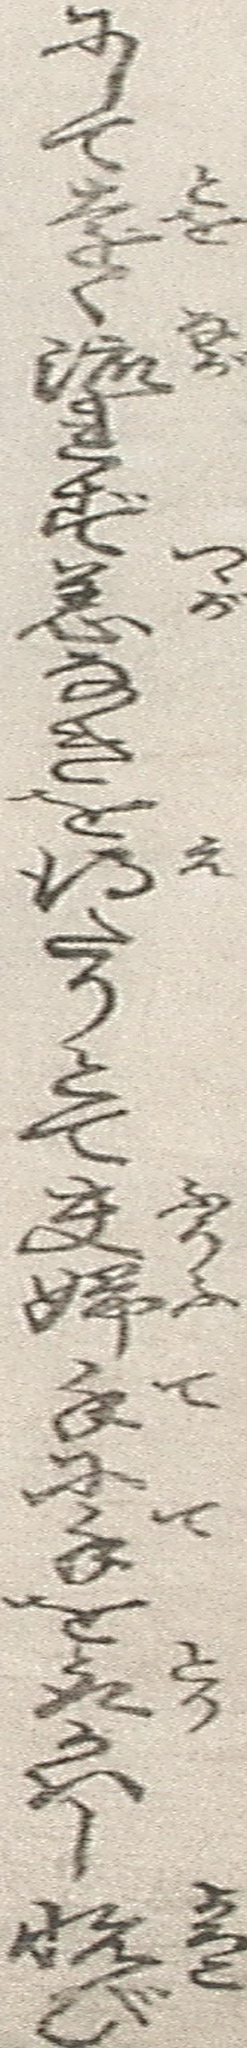にして遠く流れず恙なきを得たりとて夫婦手に手を取かハし悦び
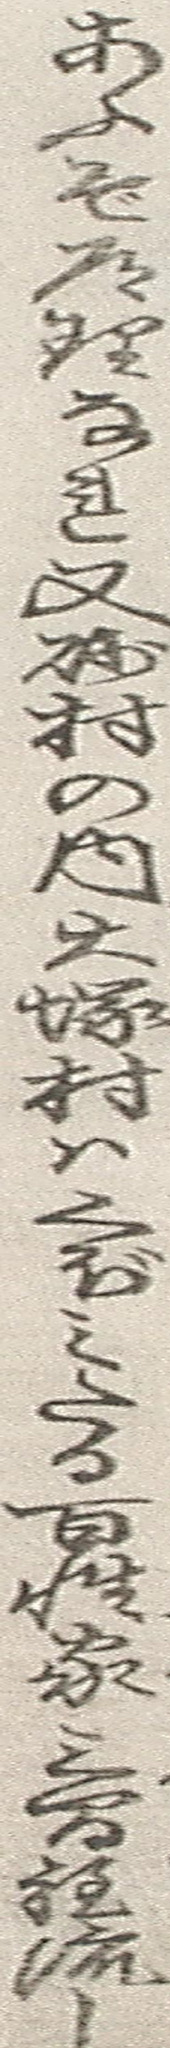あふそ道理なれ又砂村の内大塚村ハくぼミたる百性家三間程流し
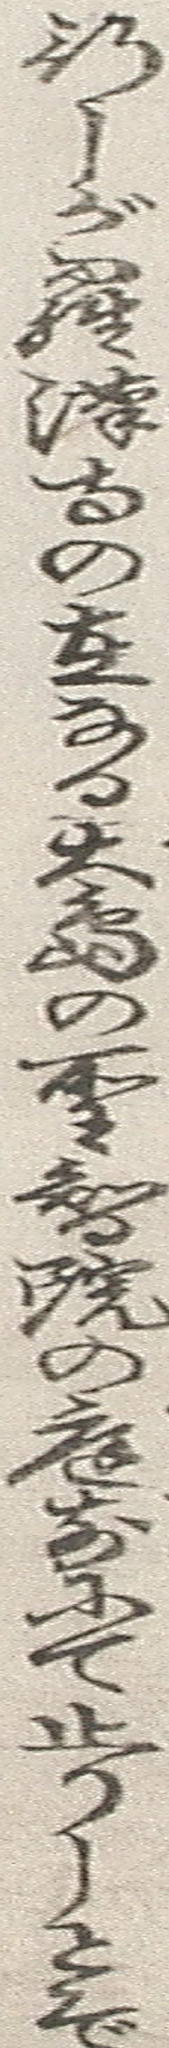行しが羅漢寺の在なる大嶋の聖智院の庭前にて止りしとぞ
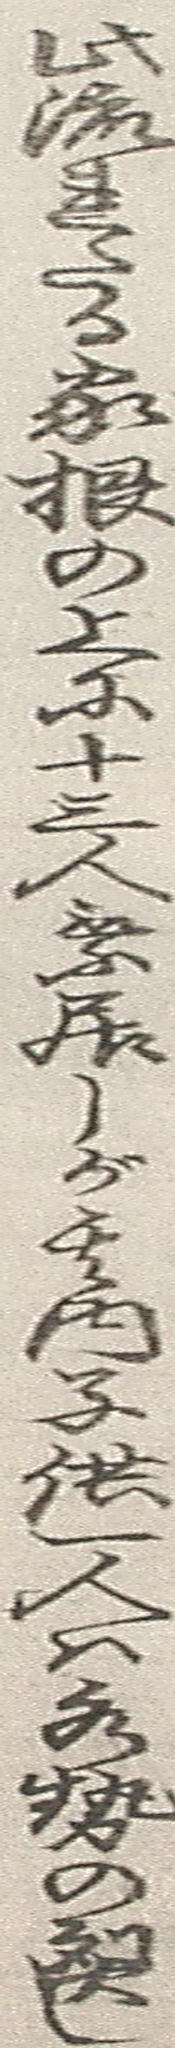此流れたる屋根の上に十三人乗居しが其内子供一人ハ水勢の烈し
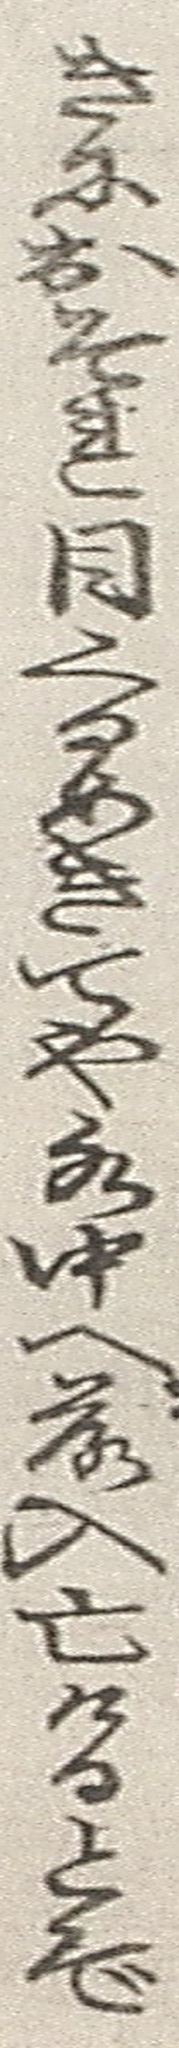きにおそれ目くるめきてや水中へ落入亡けるとぞ
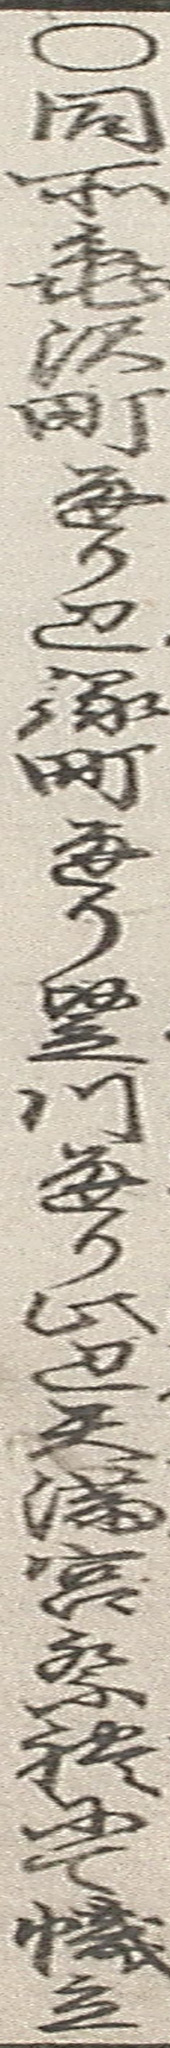◯同所亀沢町通り辺緑町通り竪川通り此辺天満宮祭礼にて幟立
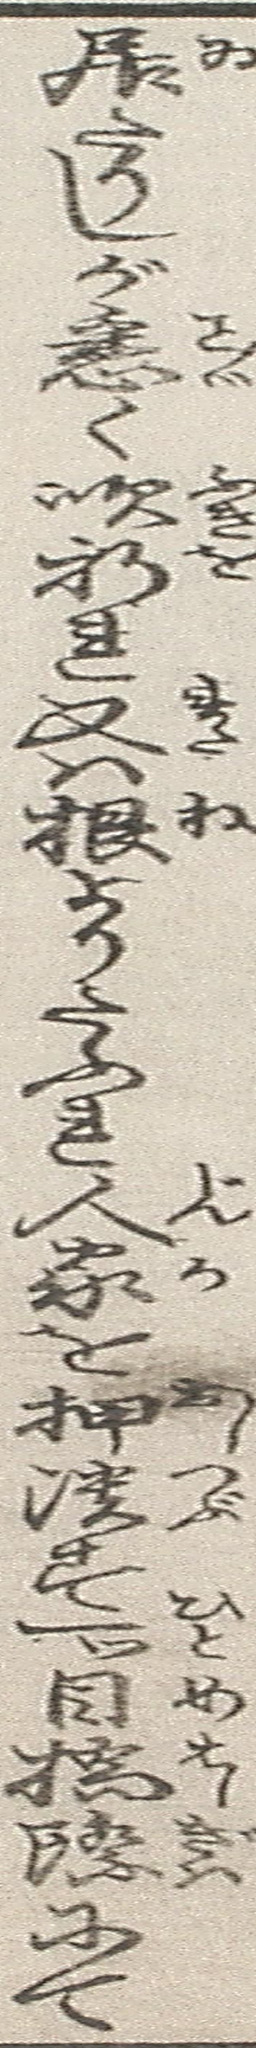居たりしが悉く吹折れ又ハ根よりたふれ人家を押潰す一ッ目橋際にて
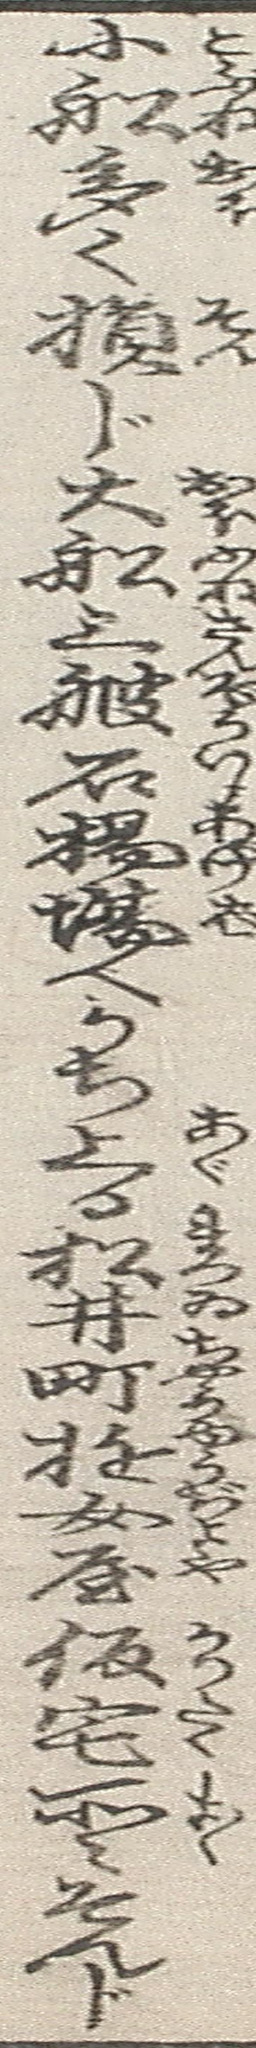小船多く損じ大船三艘石揚場へうち上る松井町遊女屋仮宅所々そんじ
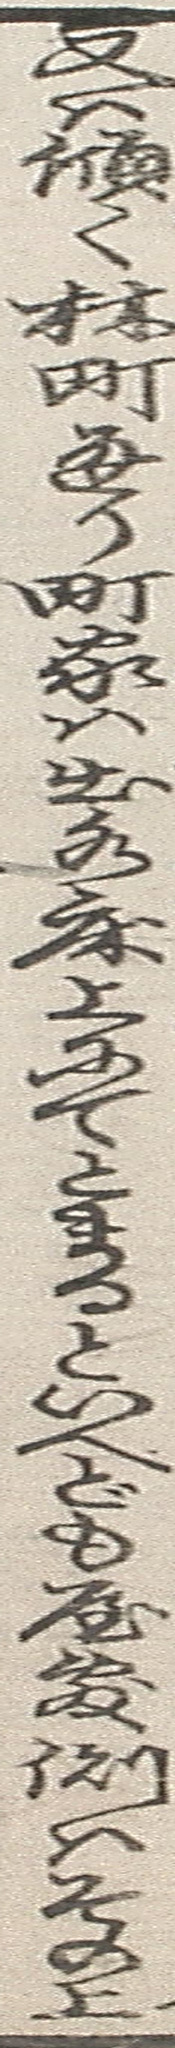又ハ傾く林町通り町家ハ出水床上にてとまるといへども屋敷側はその上
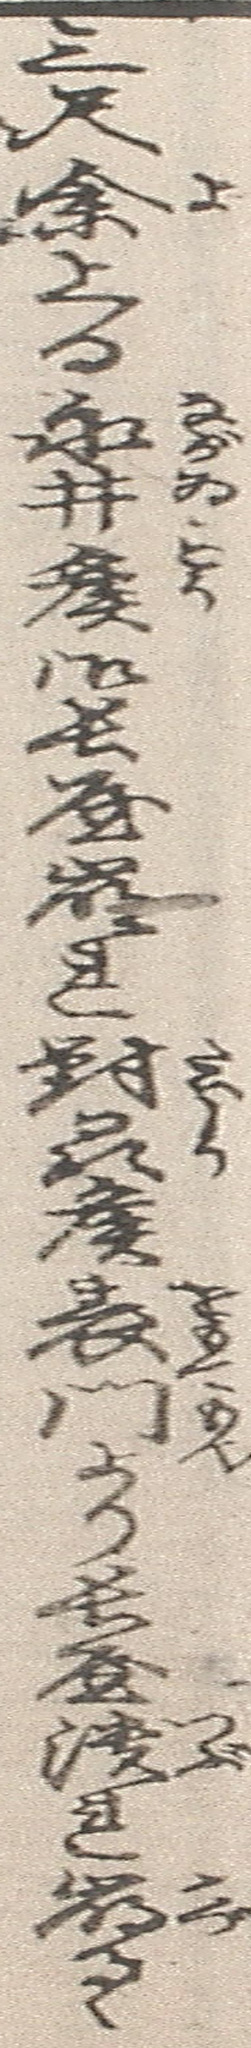三尺余上る永井矦御長屋崩れ対州矦表門より長屋潰れ崩るゝ
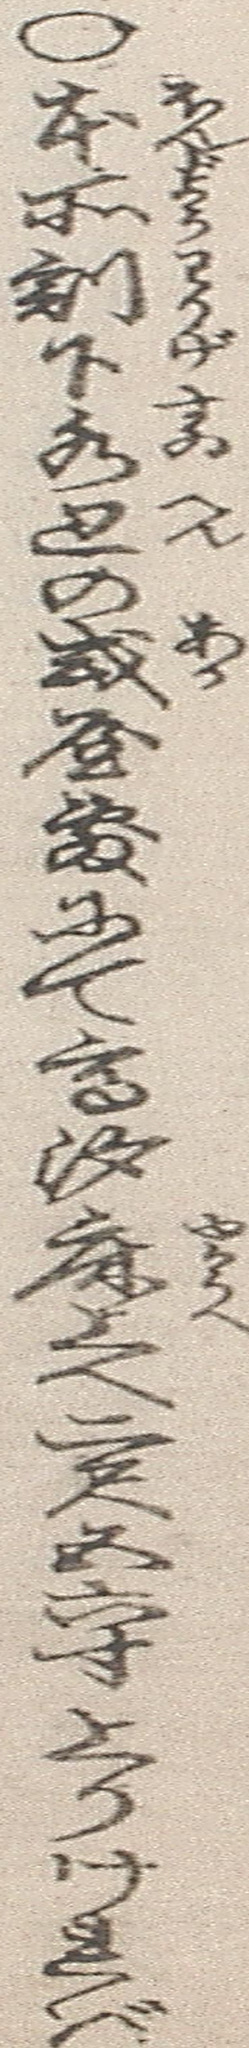◯本所割下水辺の或屋敷にて高汐床上へ二尺五六寸上りけれバ
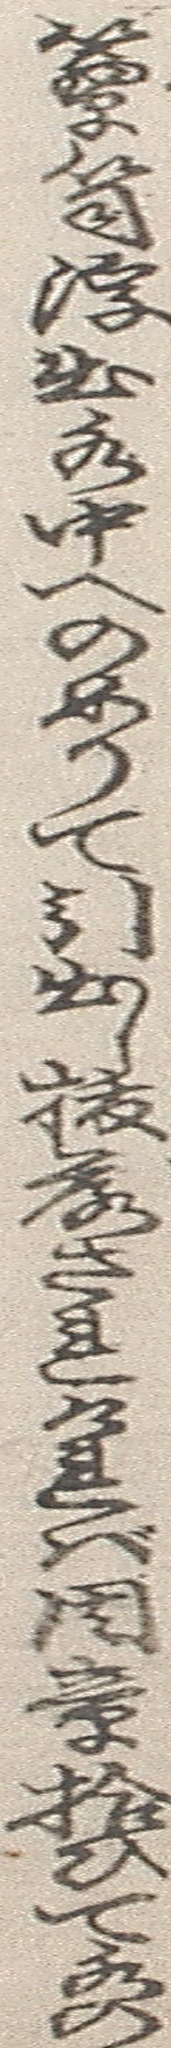箪笥浮出水中へのめりて引出し抜落されけれバ周章拾ひて水の
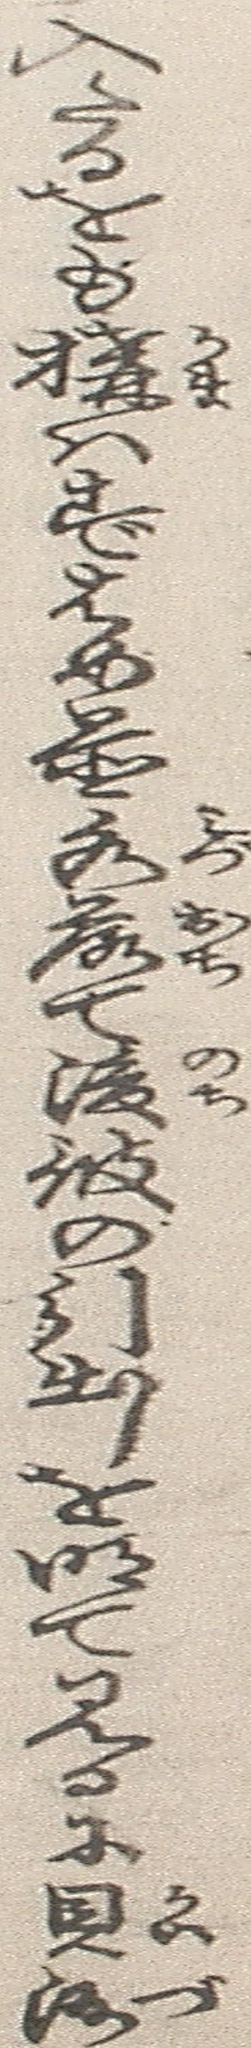入たるをも構ハずはめ置水落て後彼の引出しを明て見るに貝路
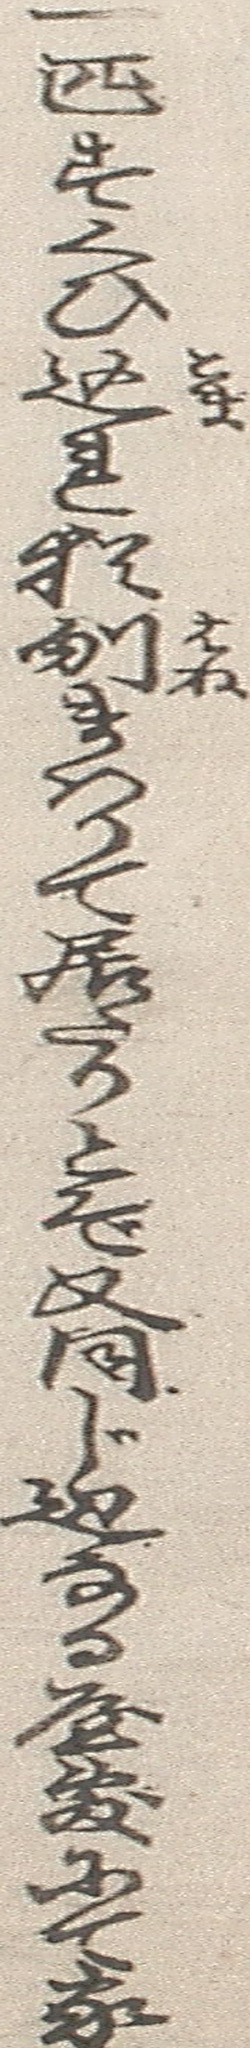一匹すくひ込まれ猶刎まハりて居たりとぞ又同じ辺なる屋敷にて家
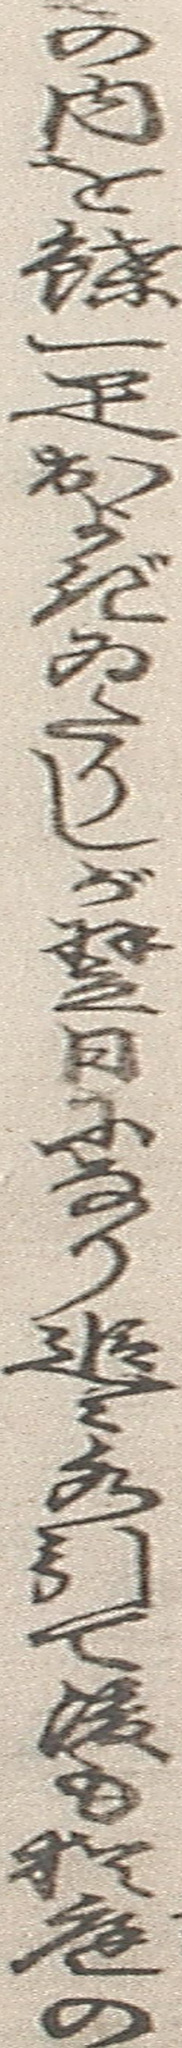の内を鰈一疋およぎいたりしが翌日になり追々水引て後も猶庭の
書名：安政風聞集　上中下　全
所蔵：東京大学地震研究所図書室 Earthquake Research Institute Library, The University of Tokyo, JAPAN
